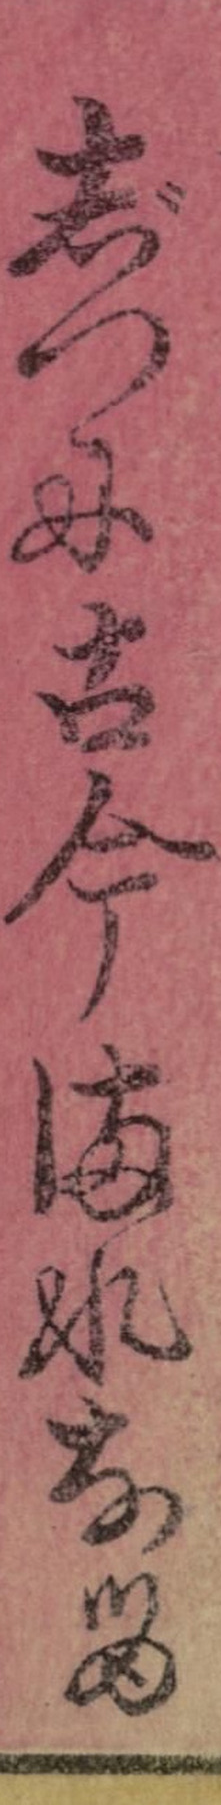じつに古今まれなる
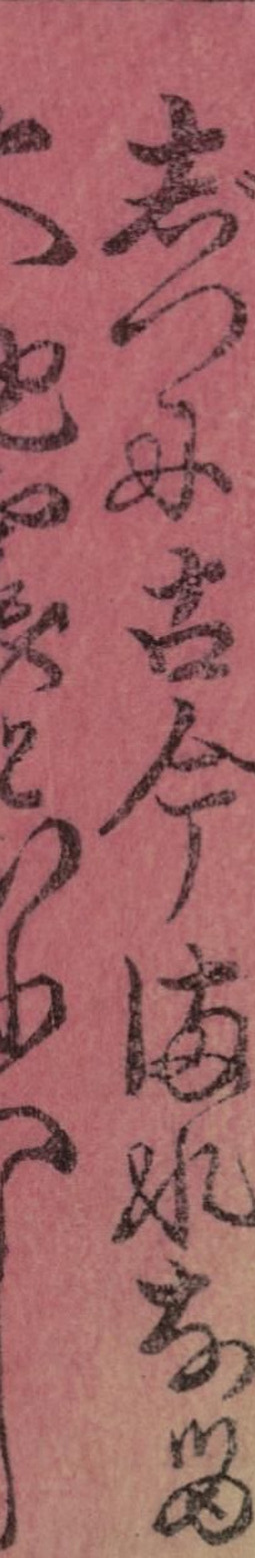大地震といふへし
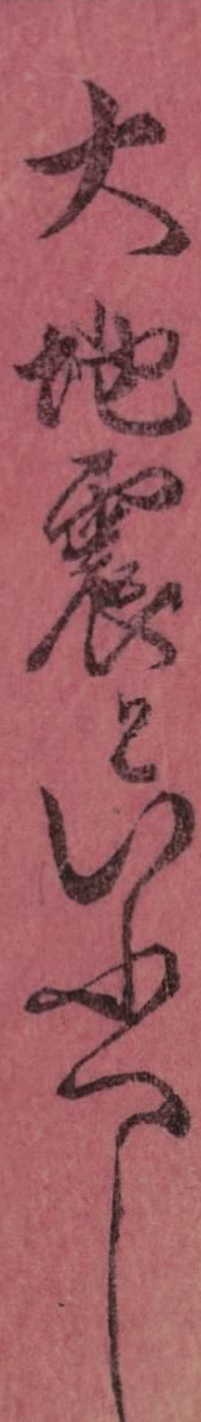大地震といふへし
